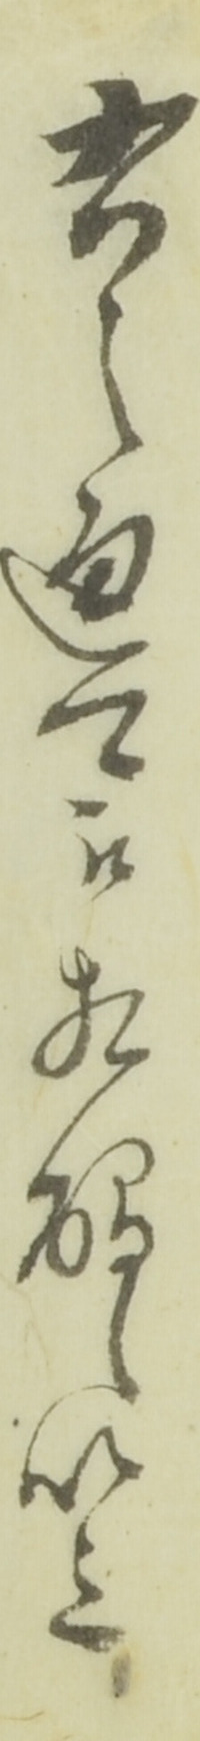右之通可被相触候以上
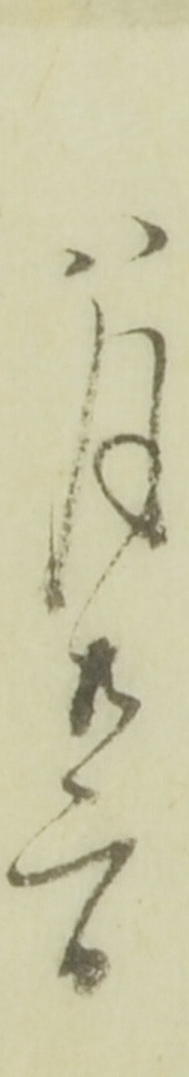八月廿二日
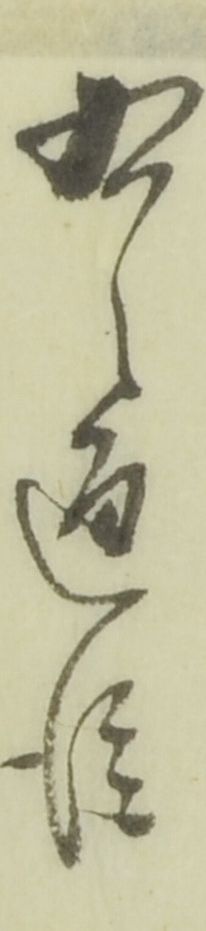右之通従
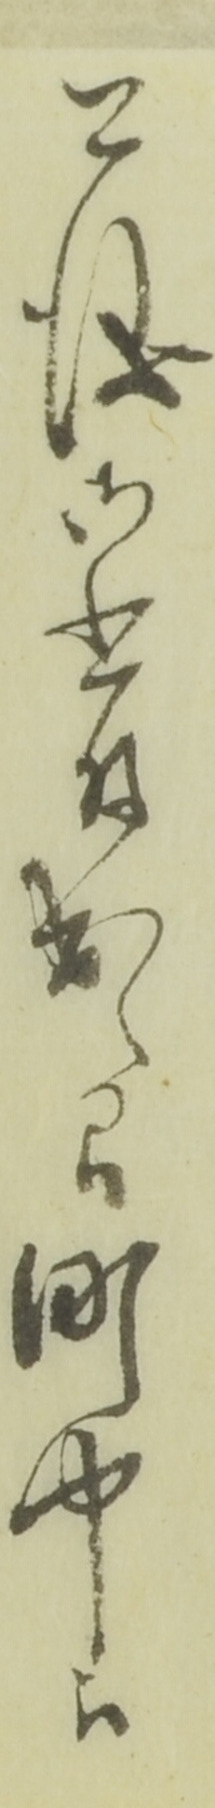公儀御書付出候間町中江
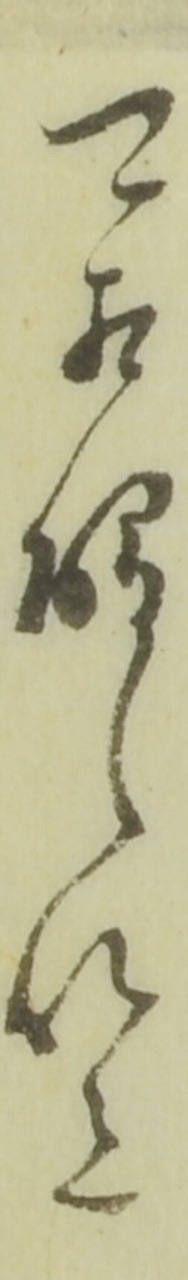可相触候以上
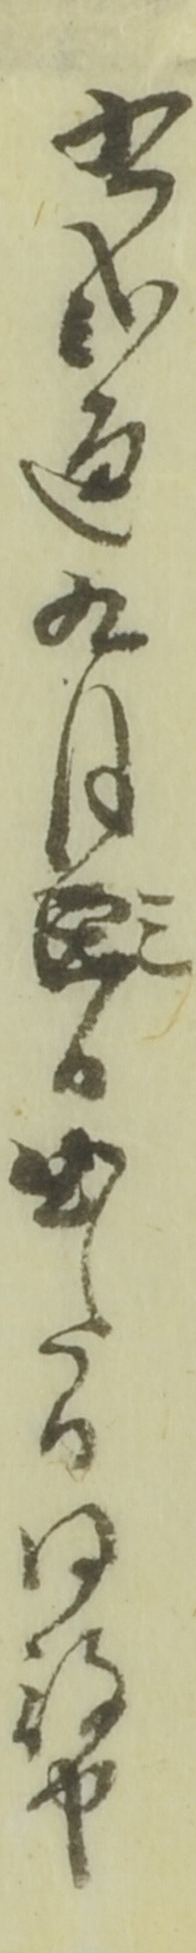右弐通九月三日出候間同役中
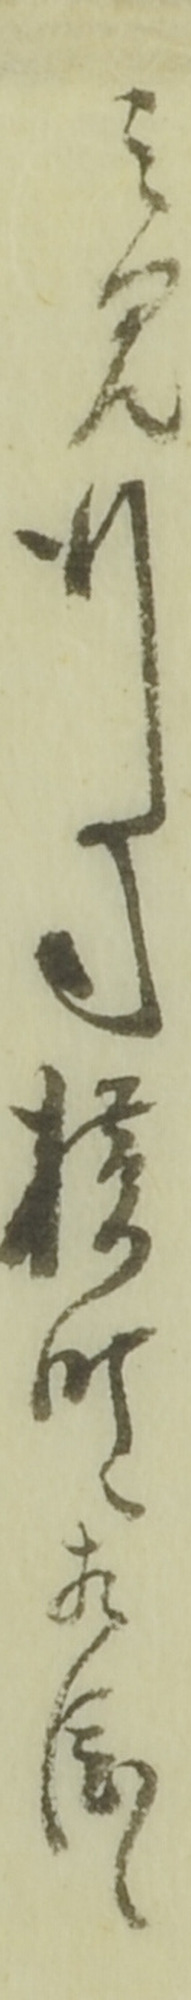之見行用横町へ相渡候
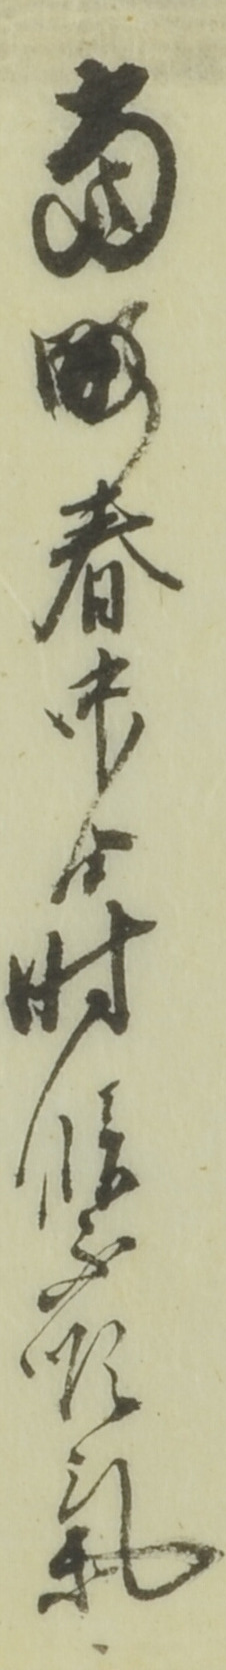当春中ゟ時候不順気
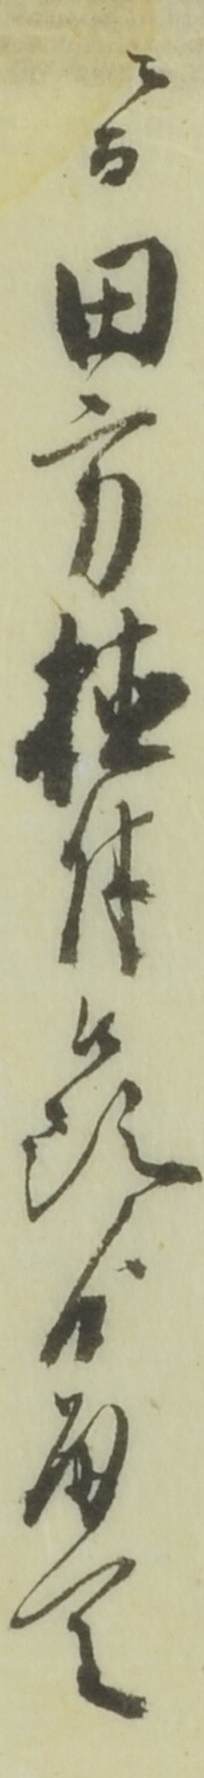ニ而田方植付候頃ゟ雨天
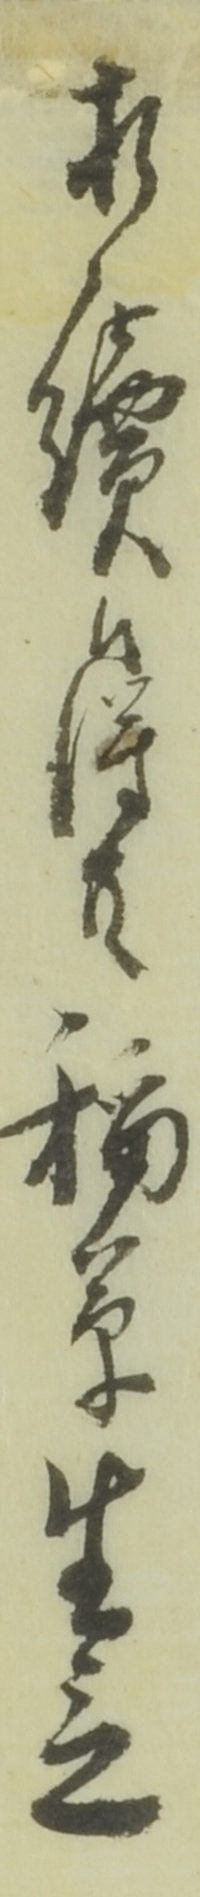打続候得共稻草生立
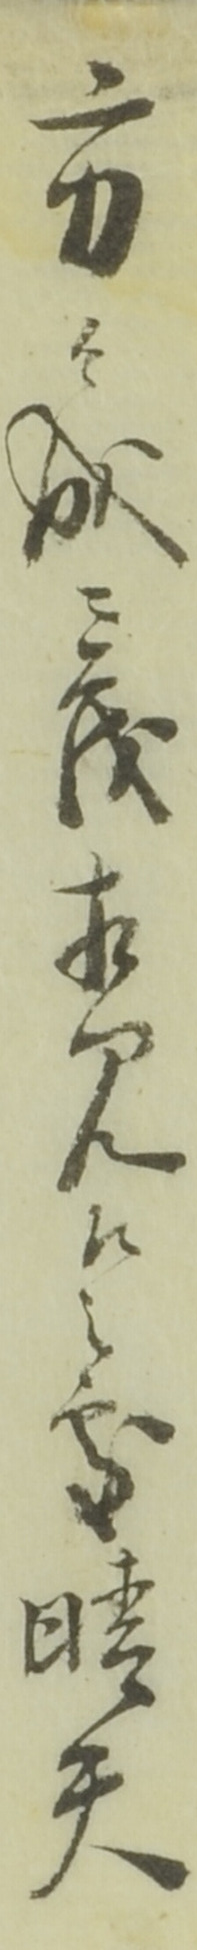方ゝ成ニ茂相見候之処晴天
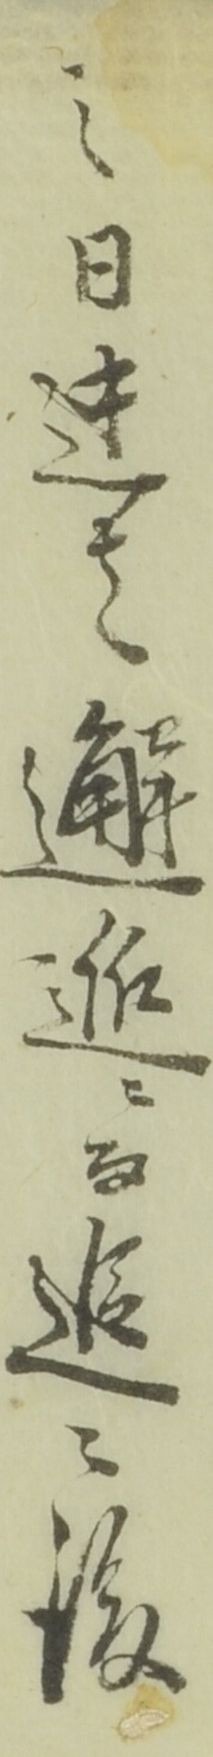之日迚者邂逅ニ而追ゝ後
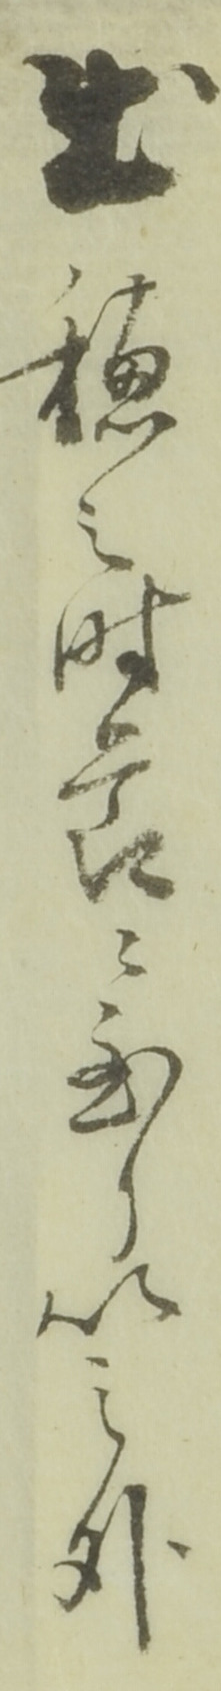出穂之時節ニ至り以之外
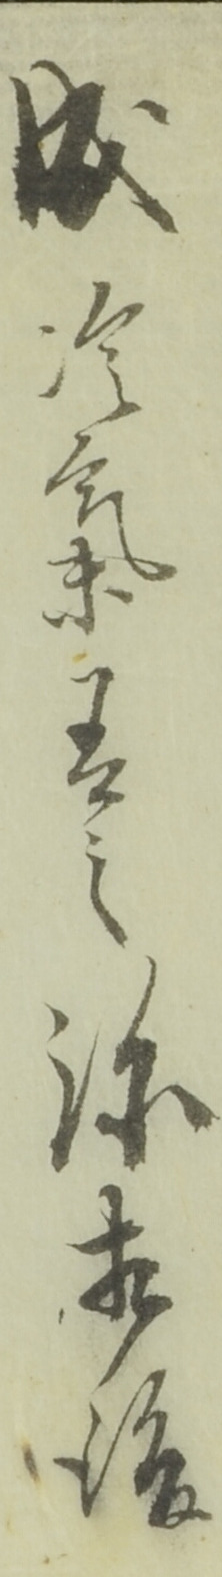成冷気有之弥相後

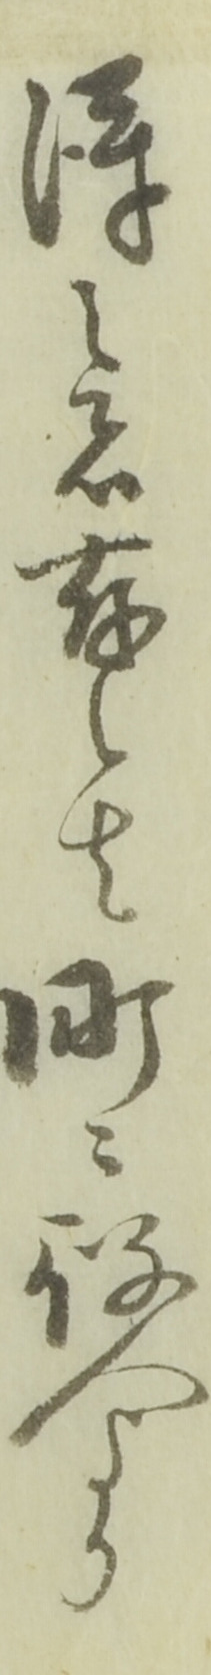得之者存候者町ゝ役人より
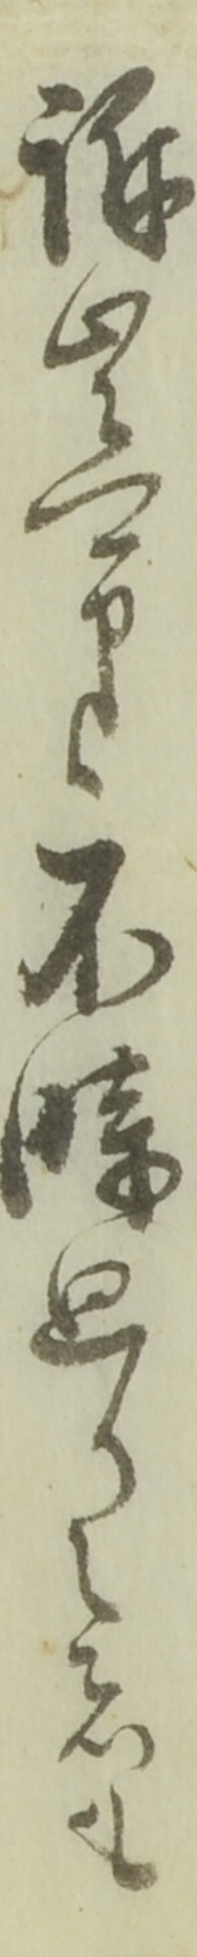訴出可申候不勝廻り候者も
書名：御触書御書附控帳
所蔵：伊那市立高遠町図書館・合同会社AMANE
